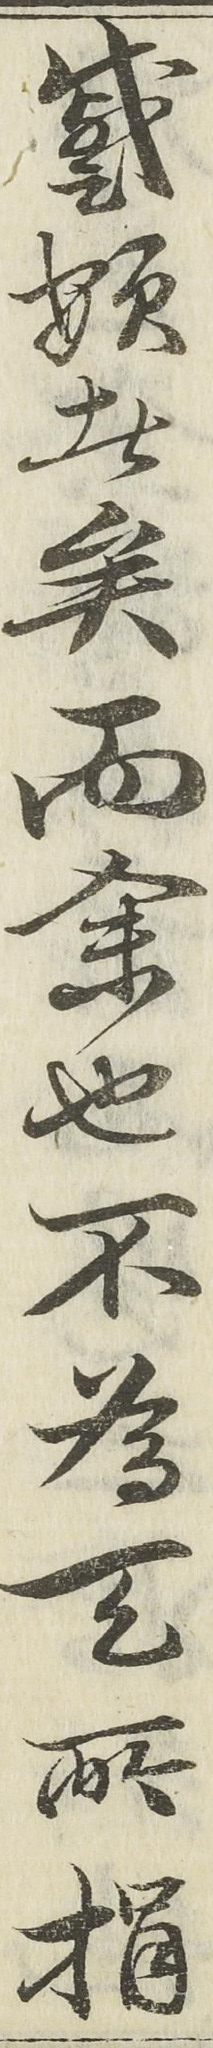蹙頞者矣而余也不為天所捐
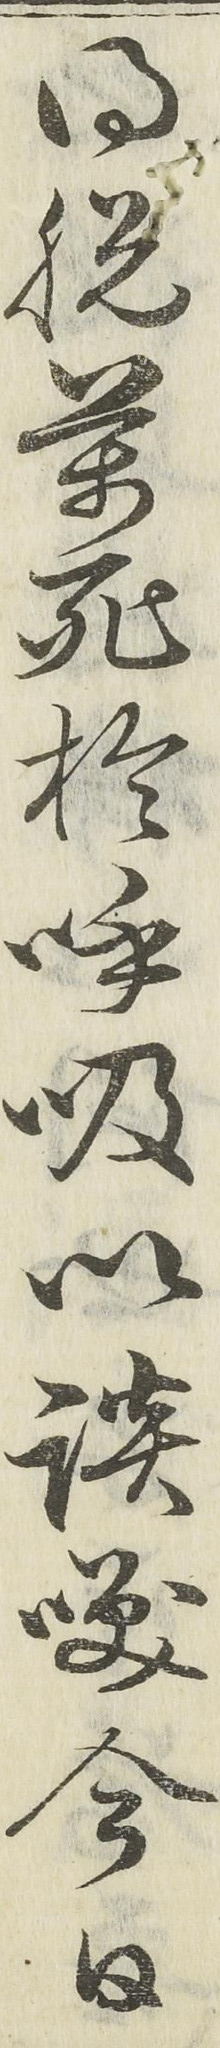得脱万死於呼吸以談笑今日
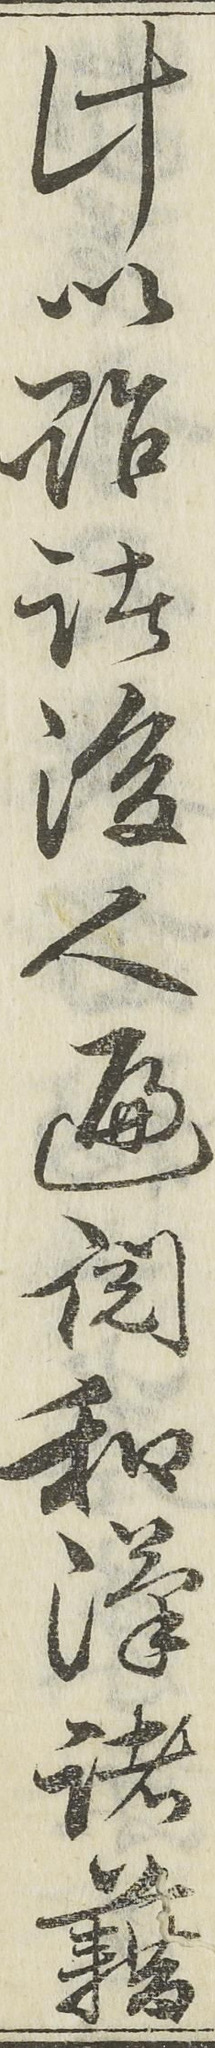計以貽諸後人遍閲和漢諸籍
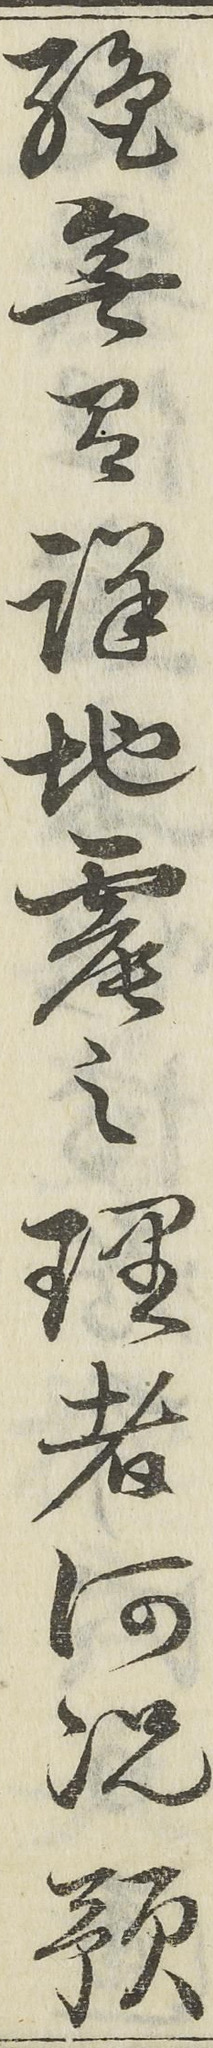絶無有詳地震之理者何況預
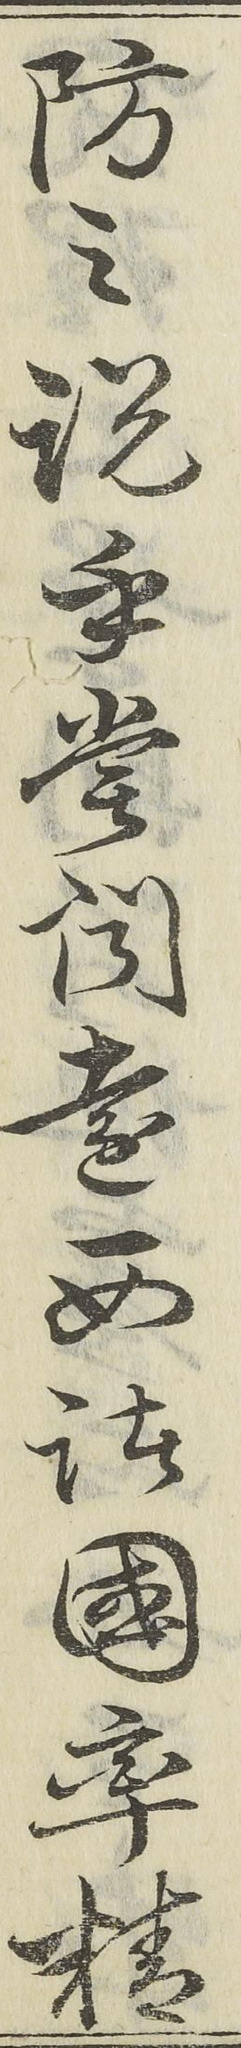防之説乎嘗聞遠西諸国率精

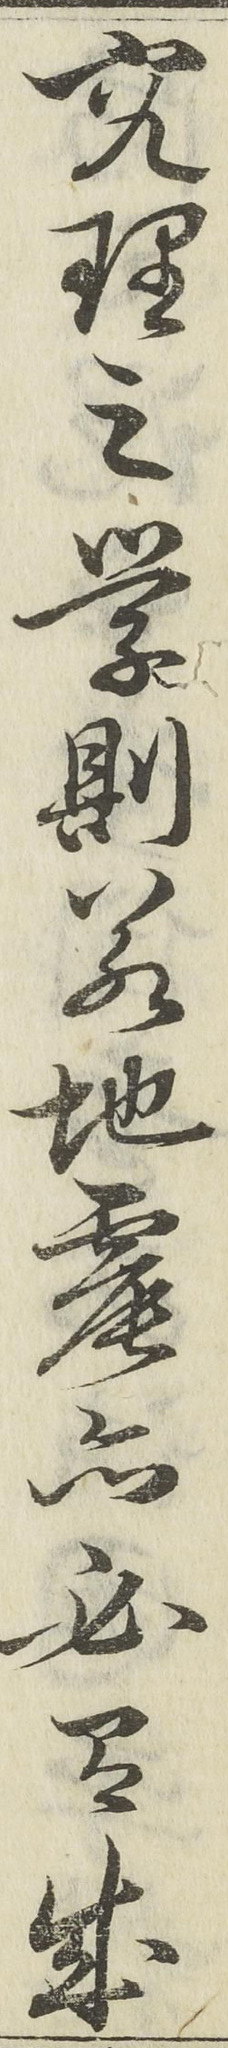究理之学則若地震亦必有成
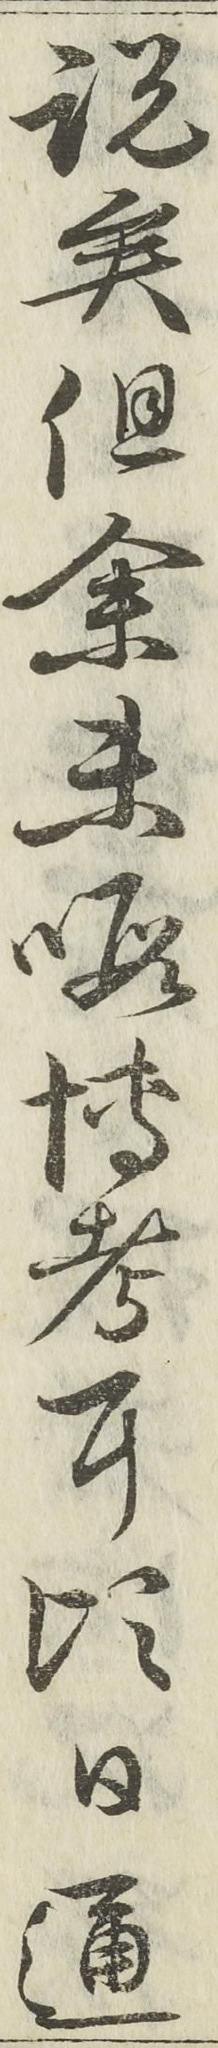説矣但余未暇博考耳頃日通
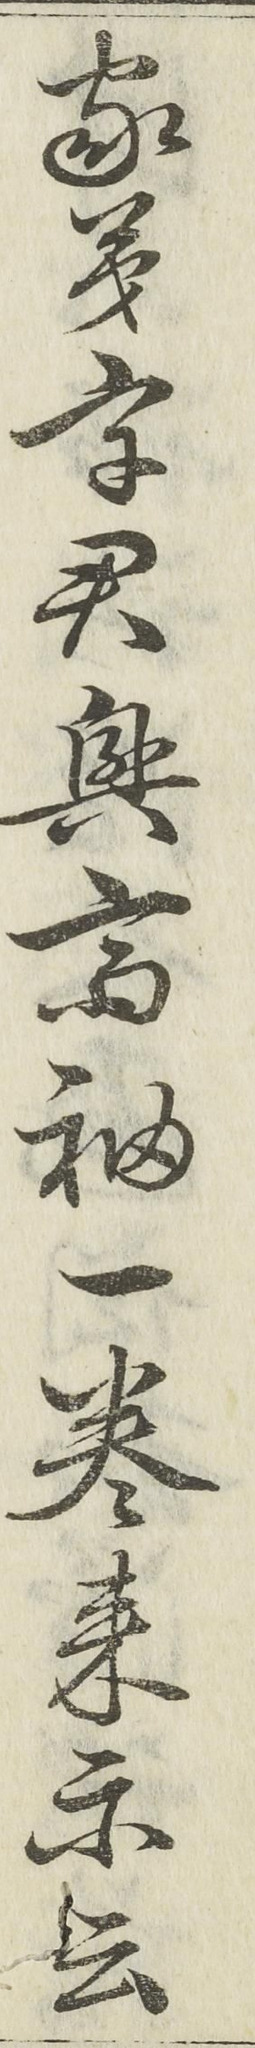家弟宇君興斎袖一巻来示云
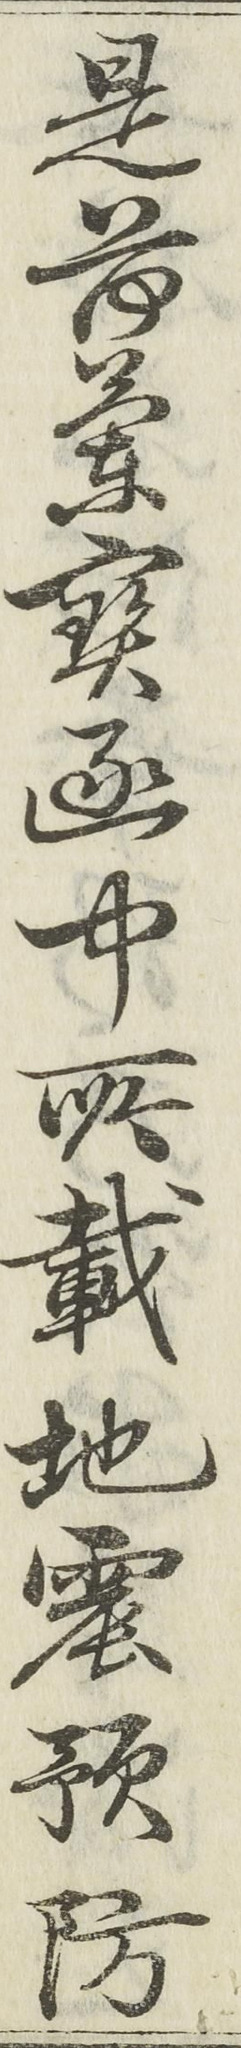是荷蘭宝函中所載地震預防
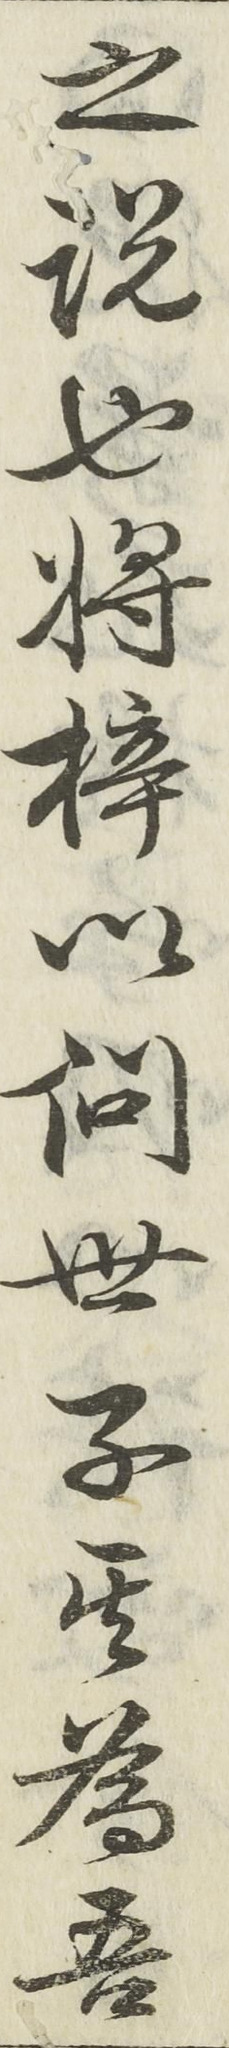之説也将梓以問世子其為吾
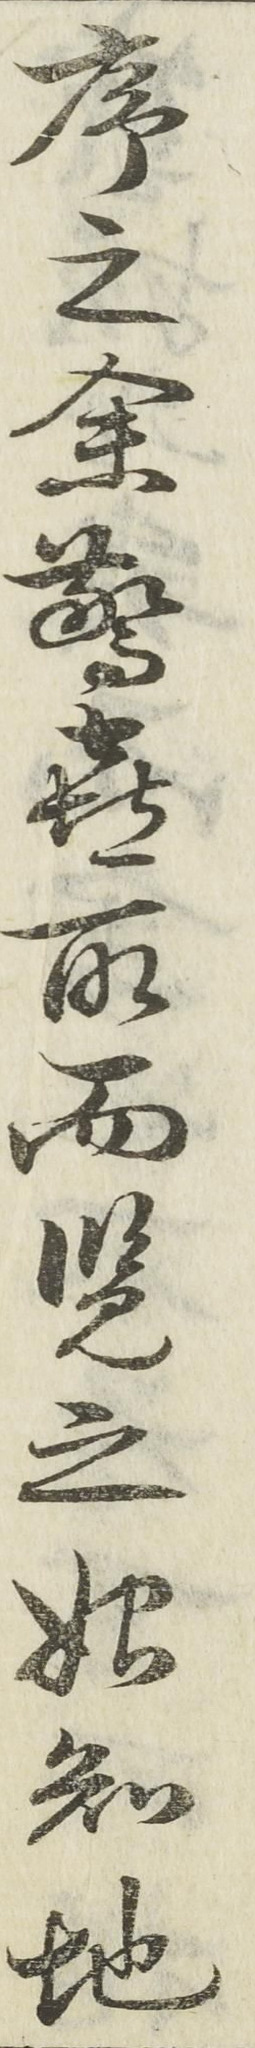序之余驚喜取而覧之始知地
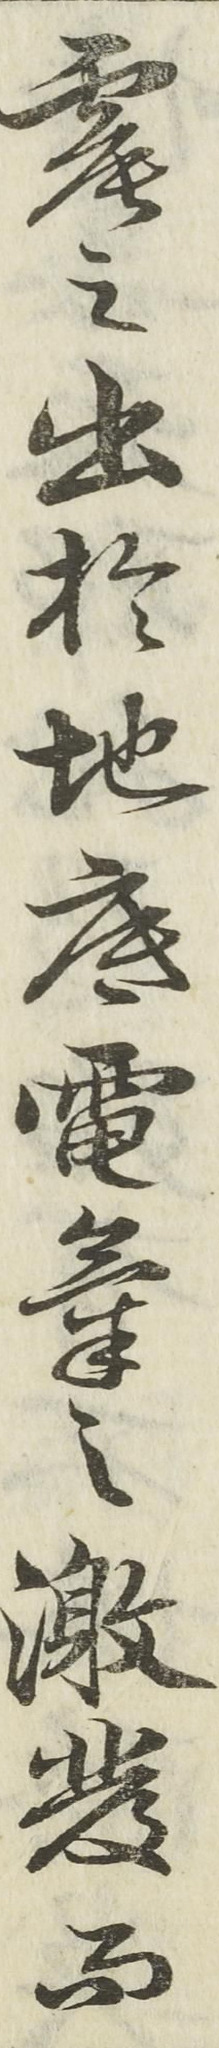震之出於地底電気之激発而
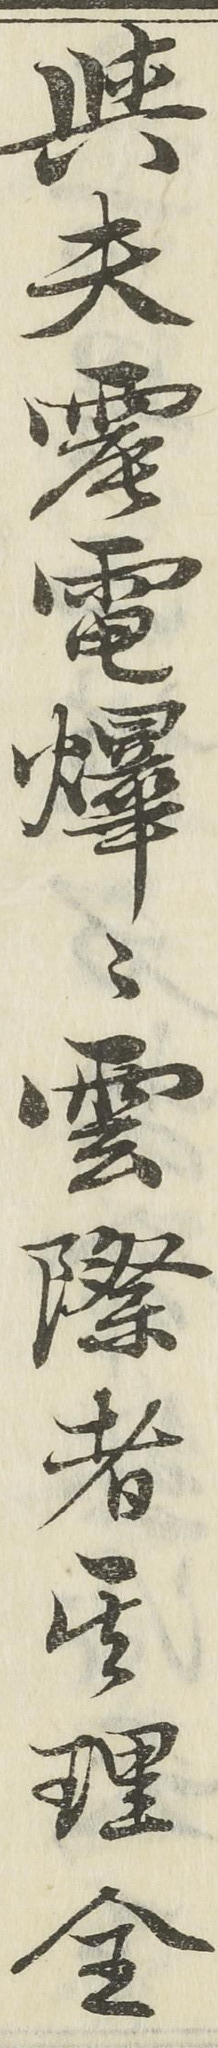与夫震電爗々雲際者其理全
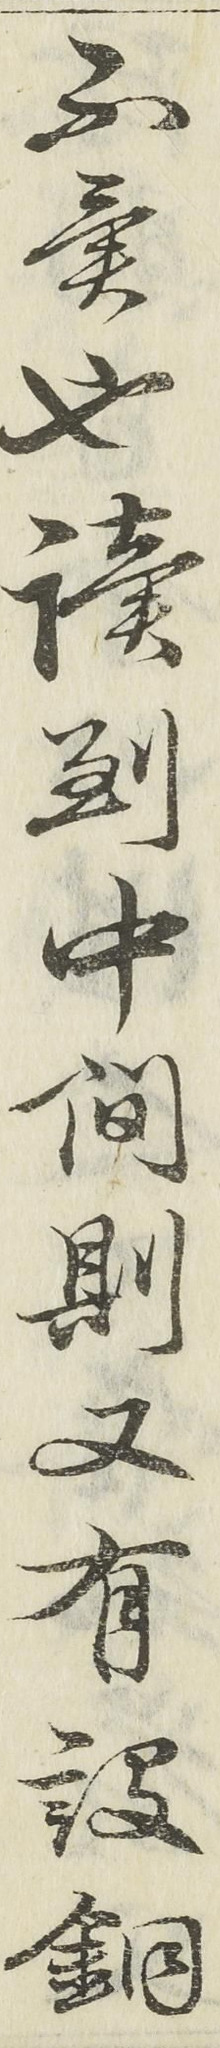不異也読到中間則又有設銅
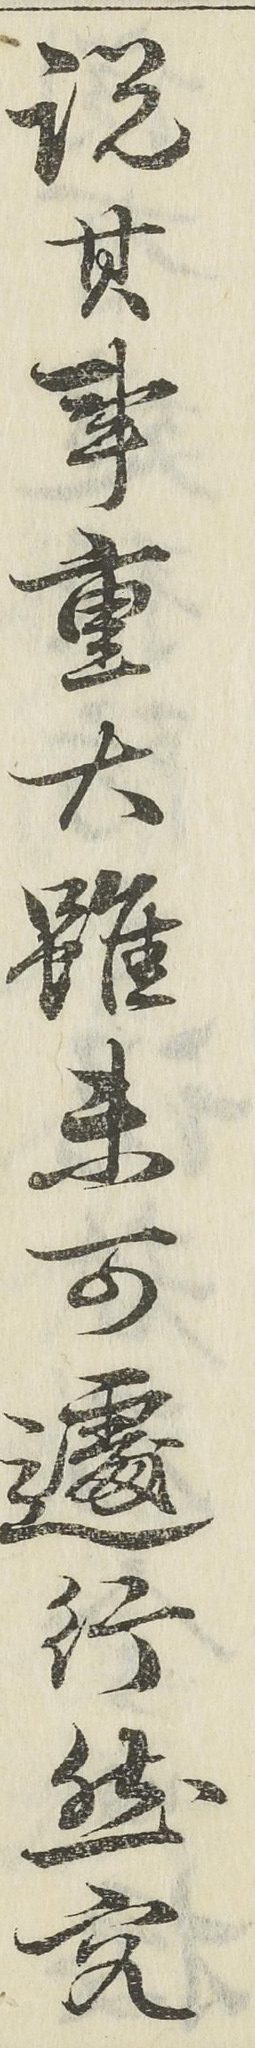説其事重大雖未可遽行然究
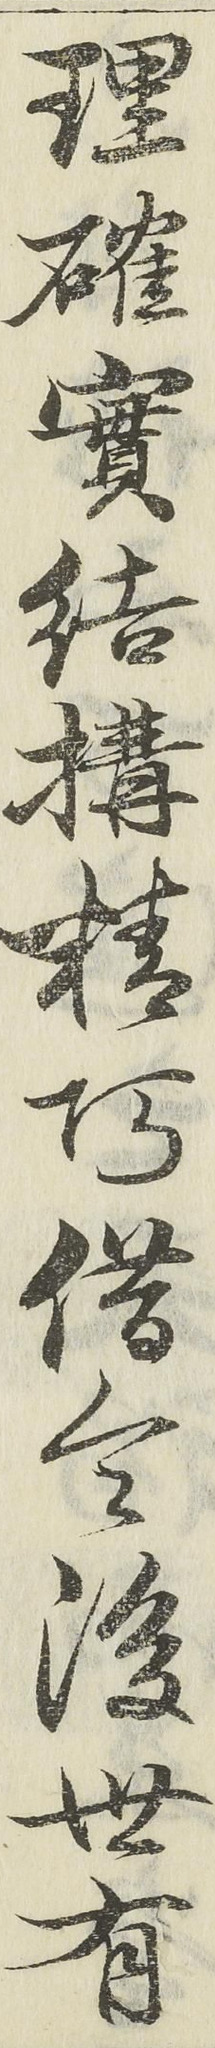理確実結構精巧借令後世有
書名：地震預防説
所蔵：東京大学地震研究所図書室 Earthquake Research Institute Library, The University of Tokyo, JAPAN
